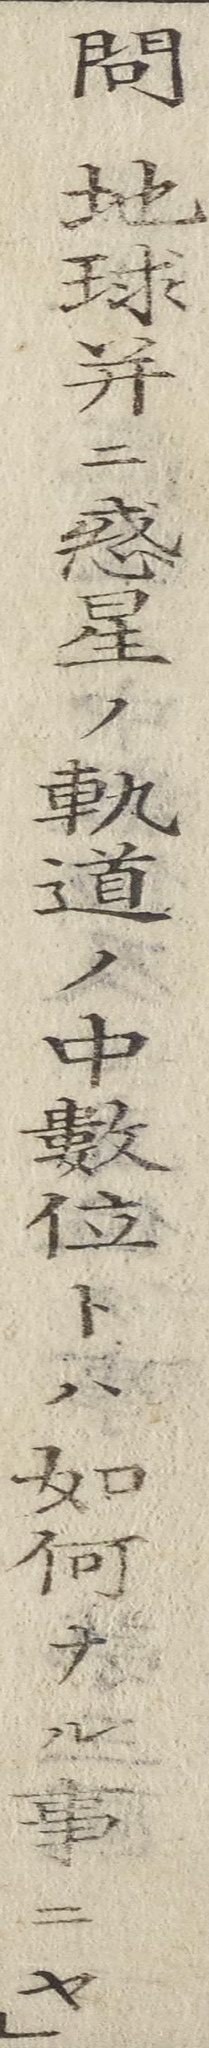問地球幷ニ惑星ノ軌道ノ中数位トハ如何ナル事ニヤ」
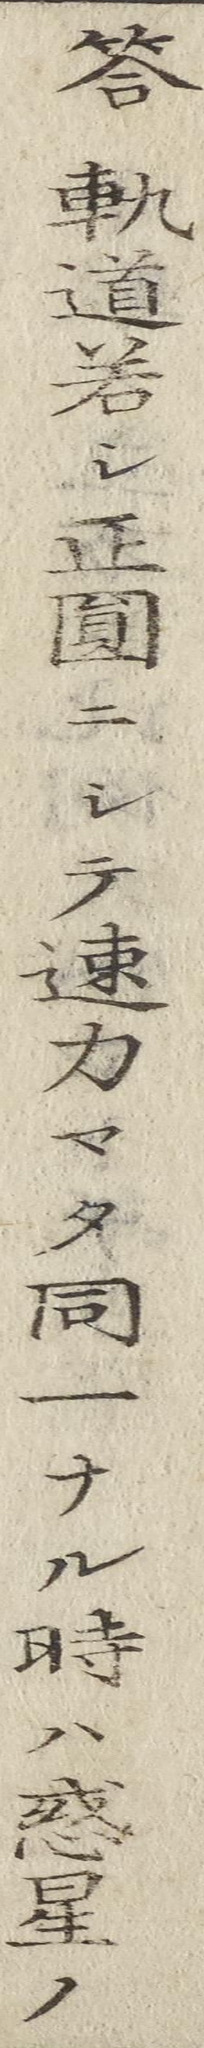答軌道若シ正円ニシテ速力マタ同一ナル時ハ惑星ノ
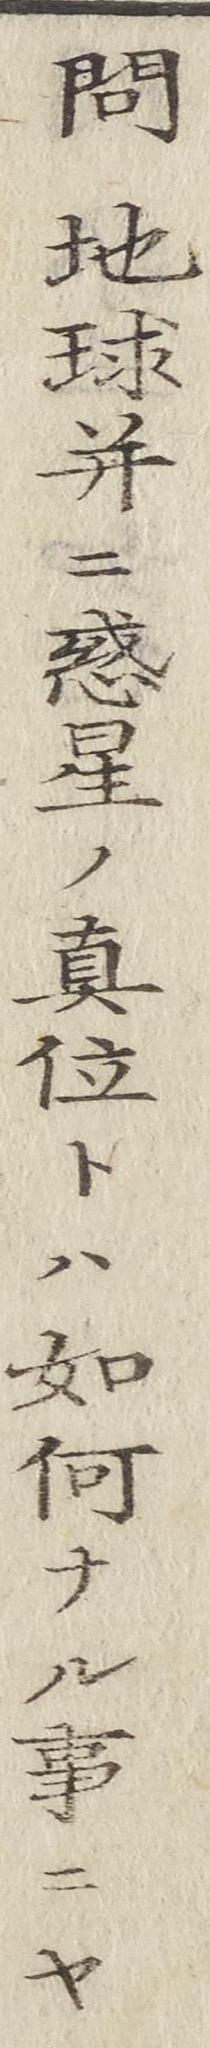問地球幷ニ惑星ノ真位トハ如何ナル事ニヤ
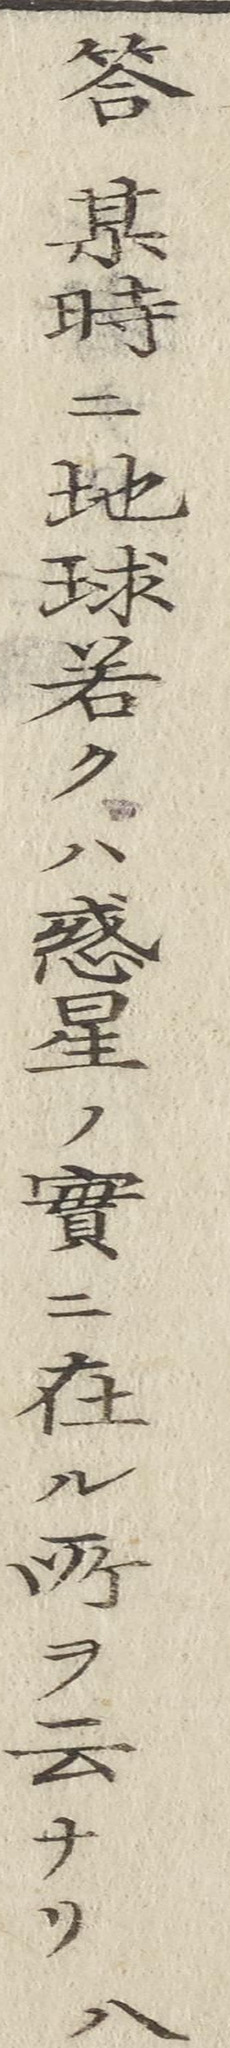答某時ニ地球若クハ惑星ノ実ニ在ル所ヲ云ナリ八図
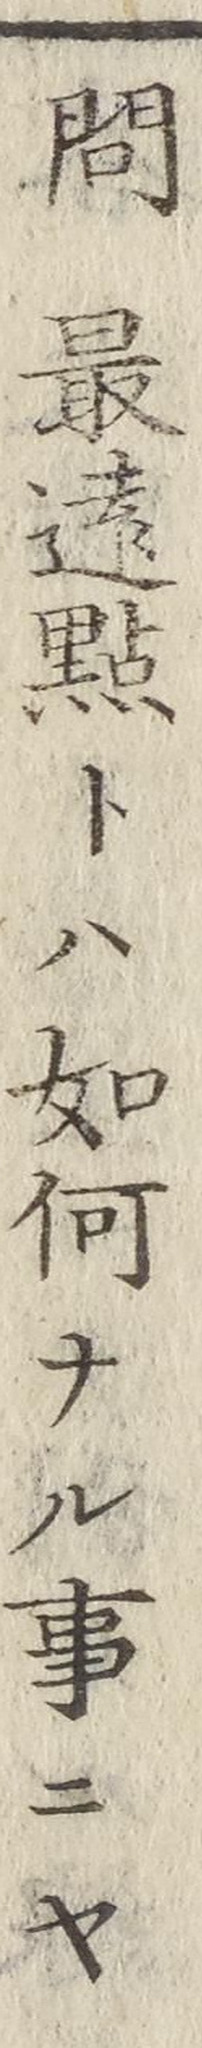問最遠点トハ如何ナル事ニヤ
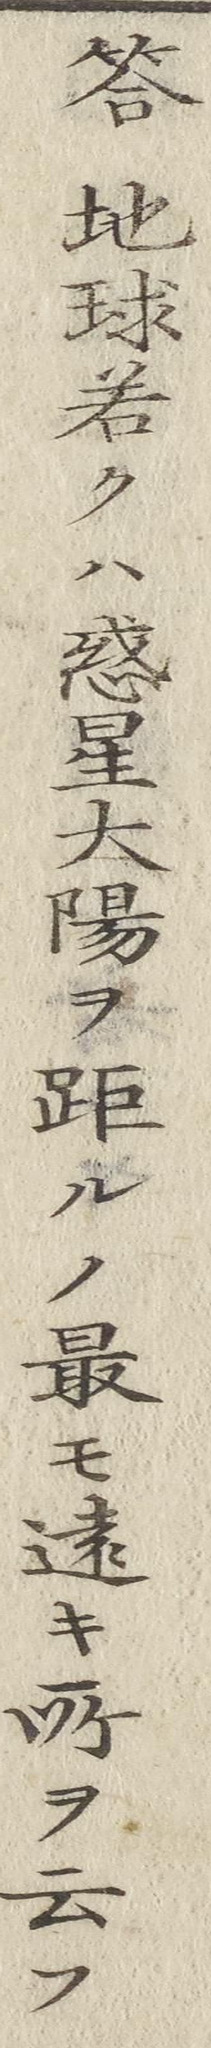答地球若クハ惑星大陽ヲ距ルノ最モ遠キ所ヲ云フ
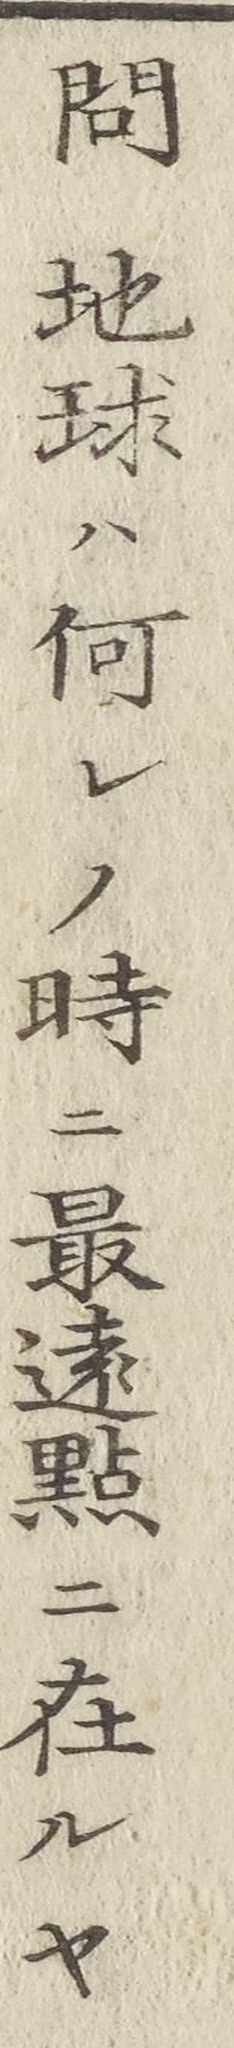問地球ハ何レノ時ニ最遠点ニ在ルヤ
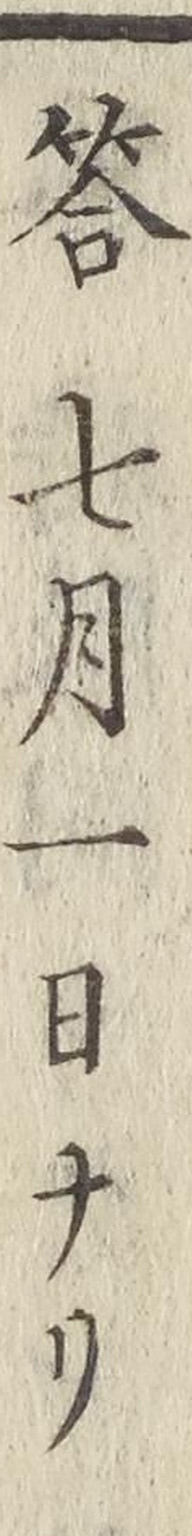答七月一日ナリ
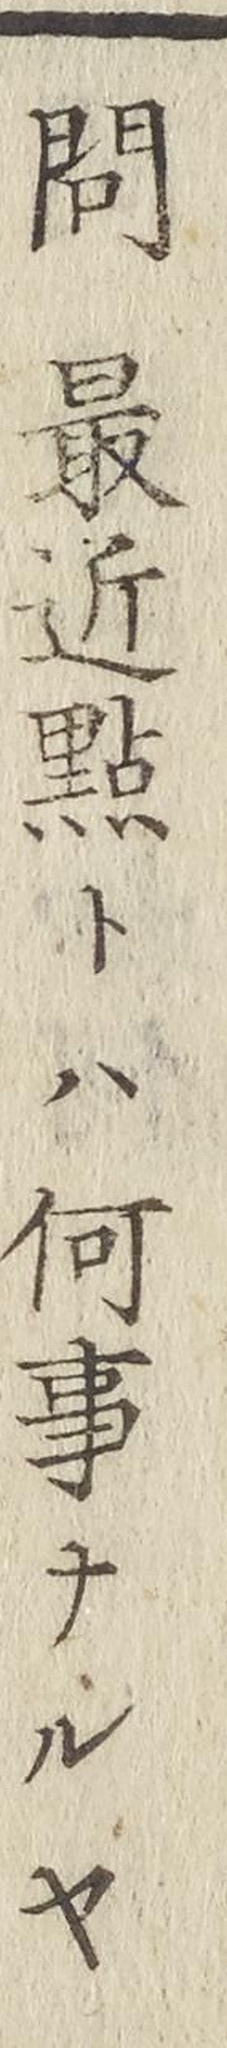問最近点トハ何事ナルヤ
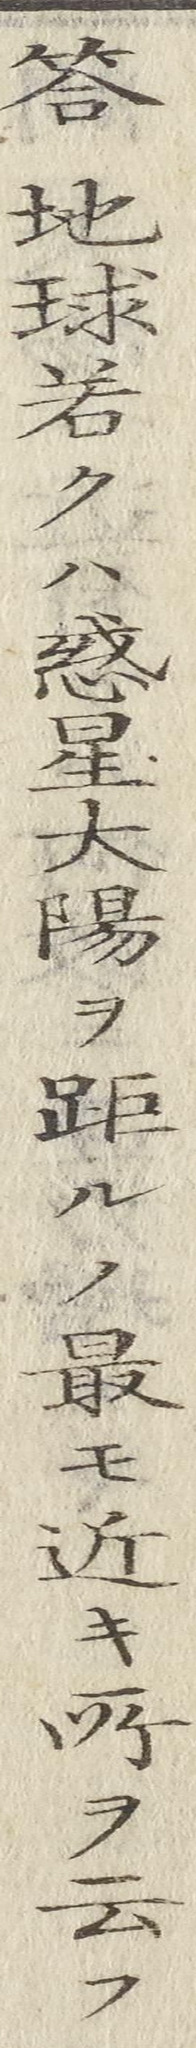答地球若クハ惑星大陽ヲ距ルノ最モ近キ所ヲ云フ
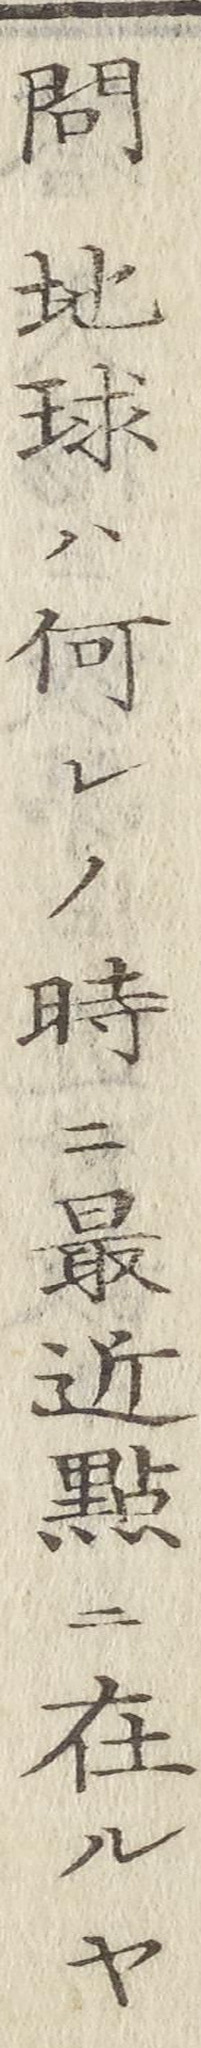問地球ハ何レノ時ニ最近点ニ在ルヤ
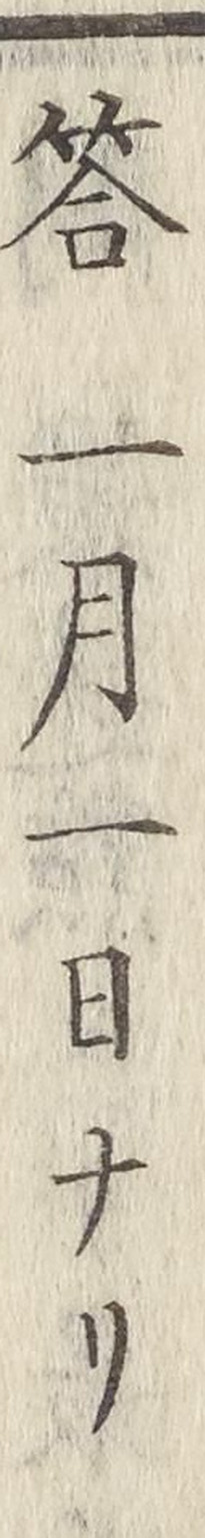答一月一日ナリ
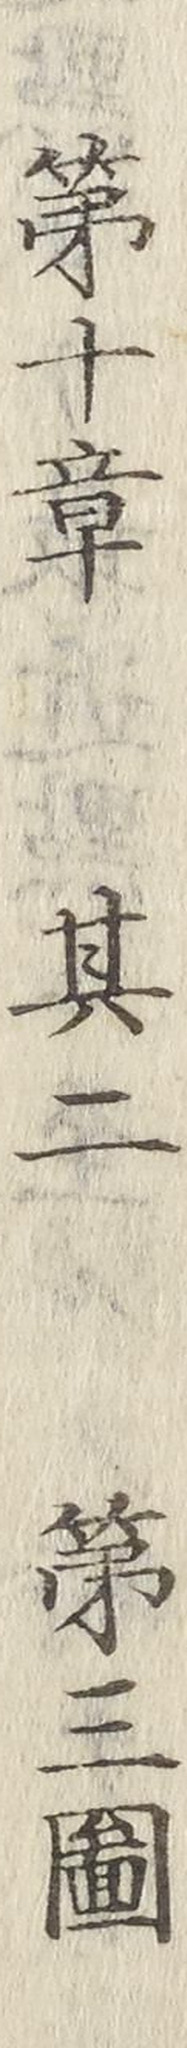第十章其二第三図
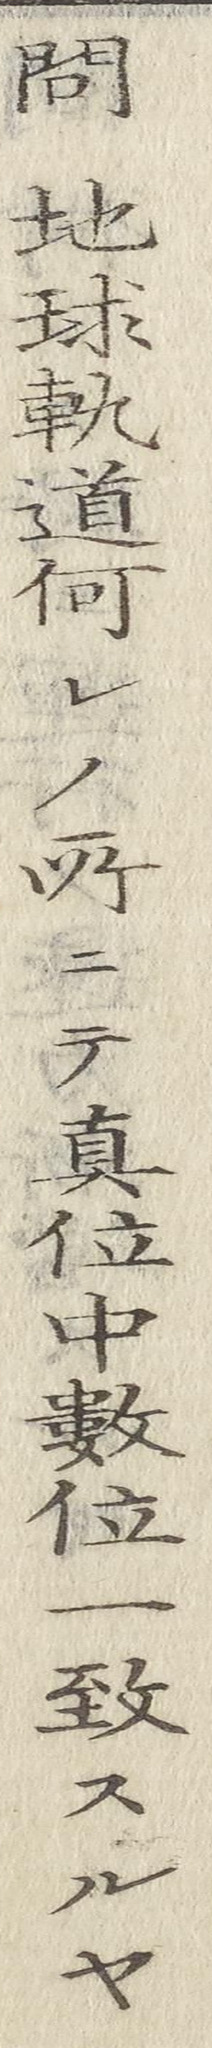問地球軌道何レノ所ニテ真位中数位一致スルヤ
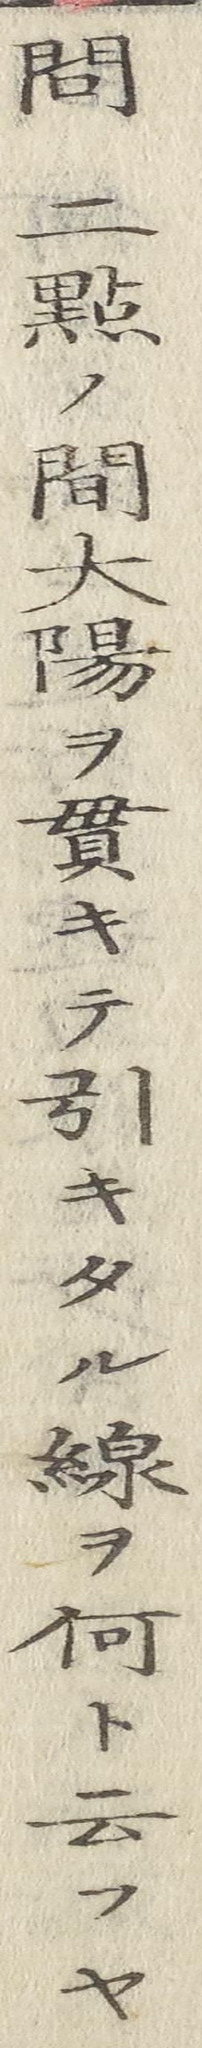問二点ノ間大陽ヲ貫キテ引キタル線ヲ何ト云フヤ
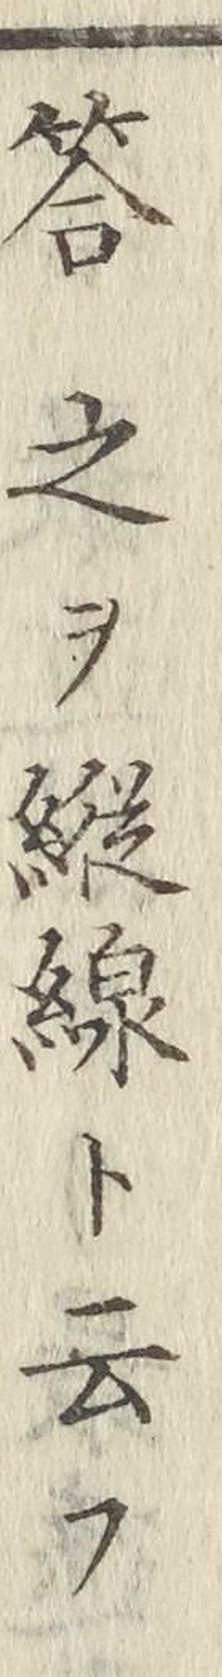答之ヲ縦線ト云フ
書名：星学圖説　上
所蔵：東京大学地震研究所図書室 Earthquake Research Institute Library, The University of Tokyo, JAPAN
